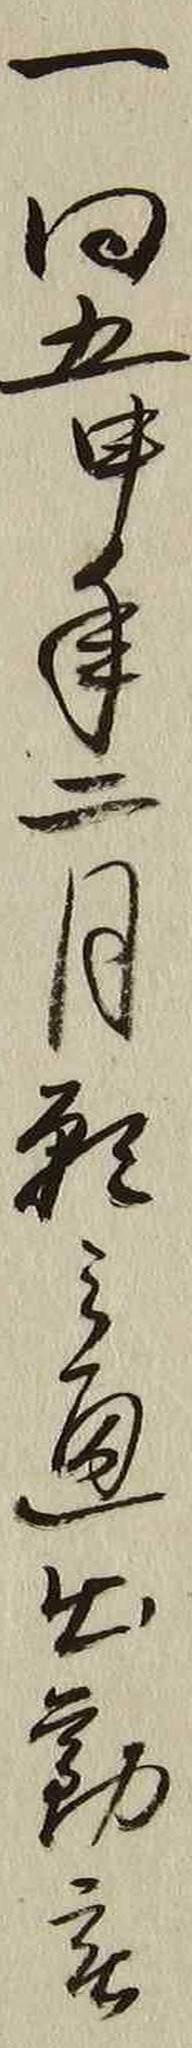一同五申年二月願之通勤被
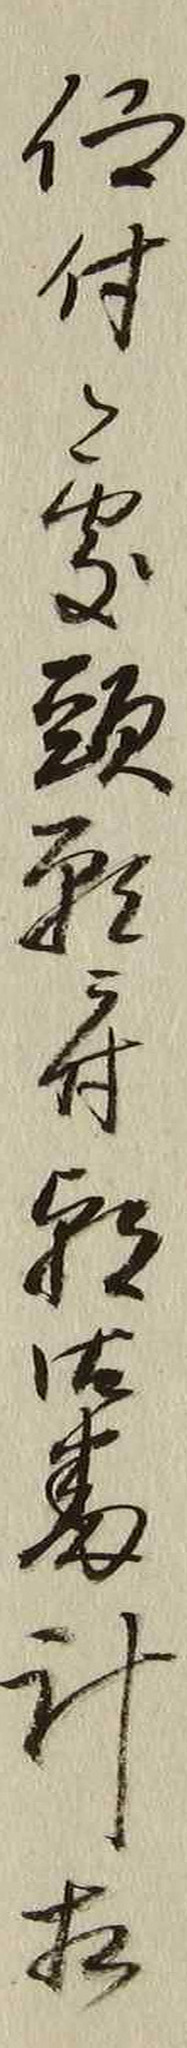仰付候処頭願ニ付朝御番計相
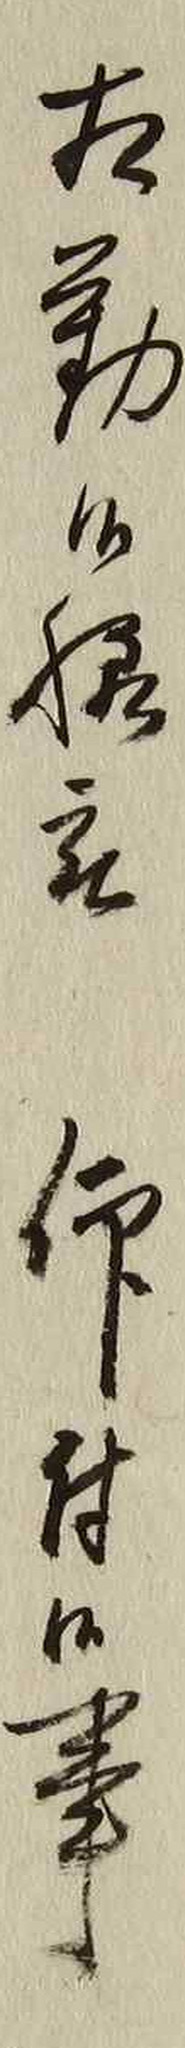相勤候様被仰付候事
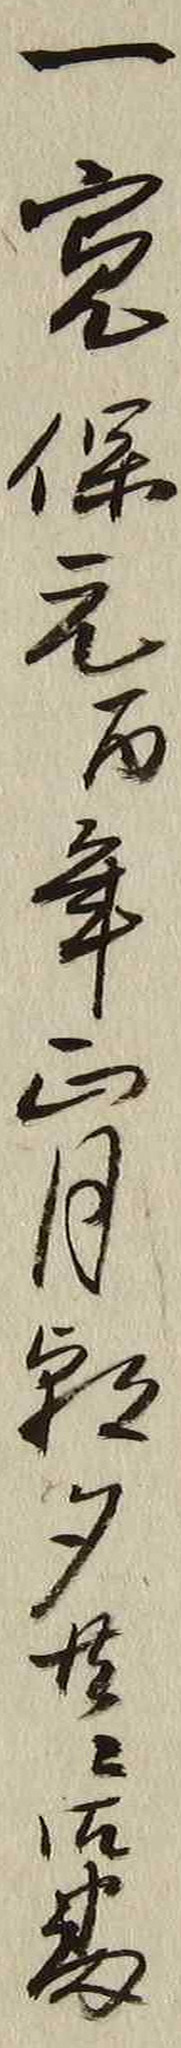一寛保元酉年正月朝夕共ニ御番
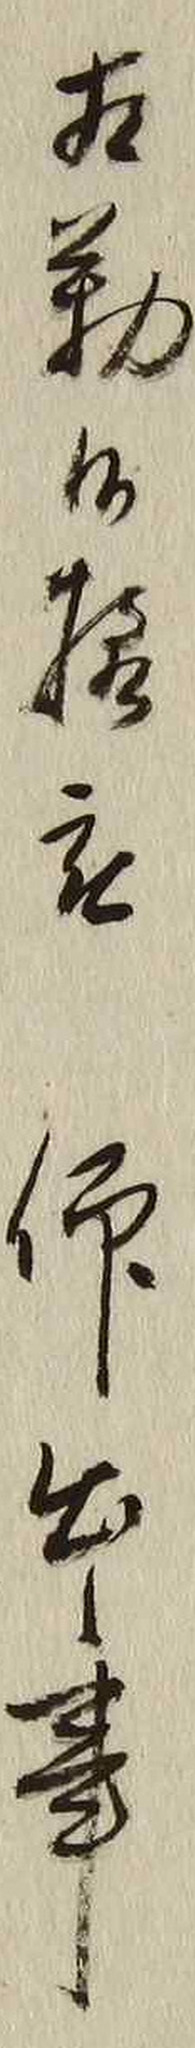相勤候様被仰出候事
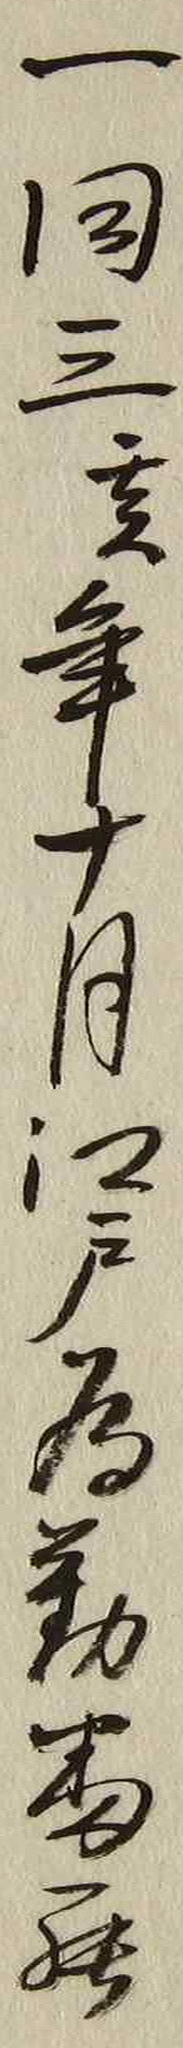一同三亥年十月江戸為勤番罷
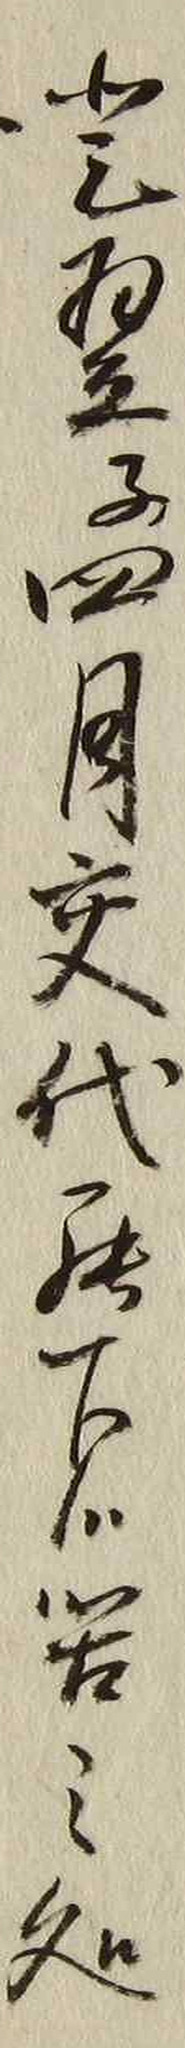登翌子四月交代罷下候筈之処
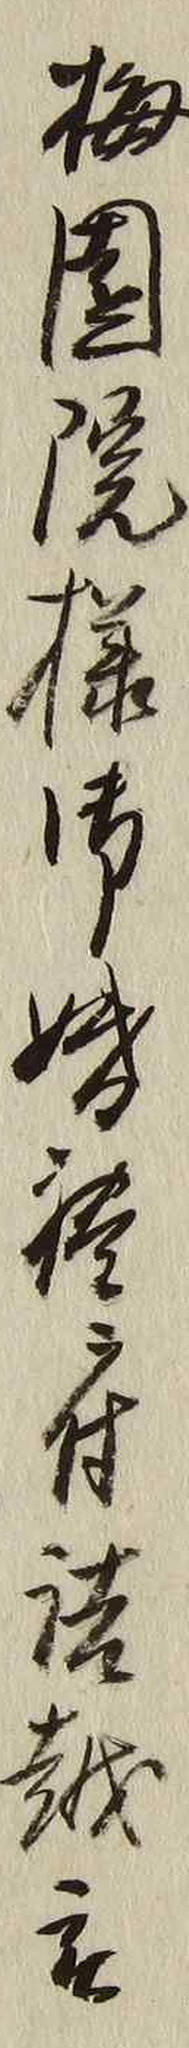梅園院様御婚礼ニ付詰越被
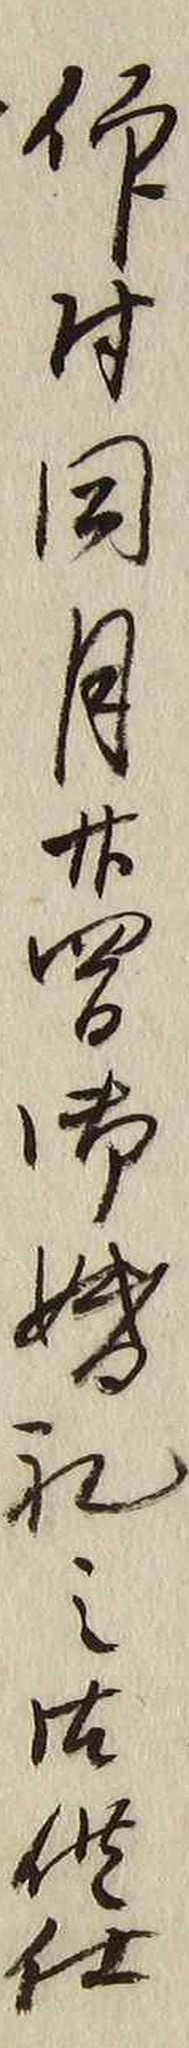仰付同月廿四日御婚礼之御供仕
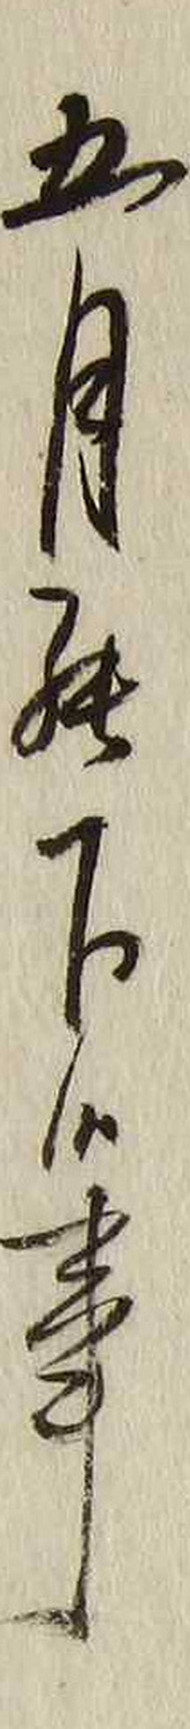五月罷下候事
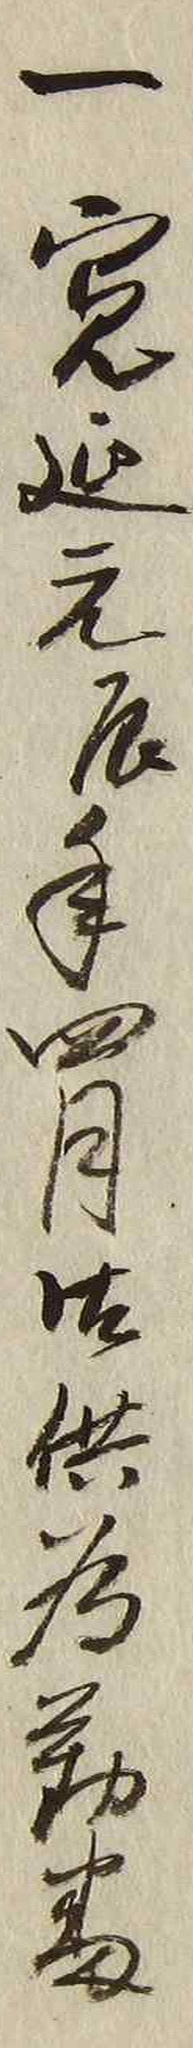一寛延元辰年四月御供為勤番
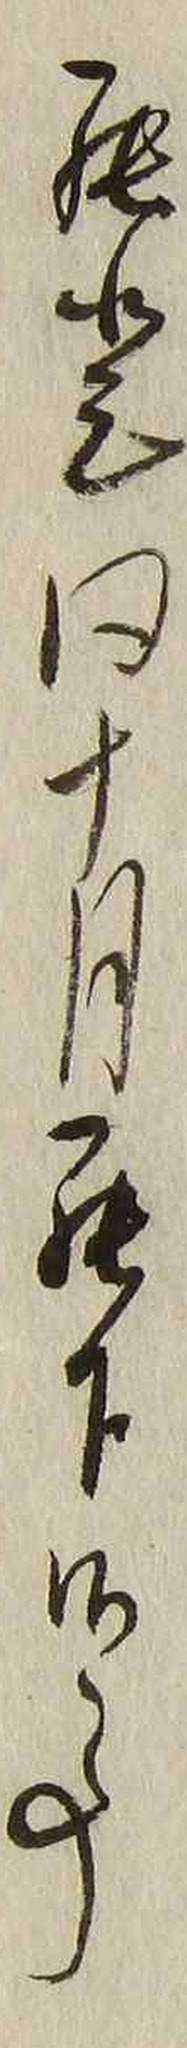罷登同十月罷下候事

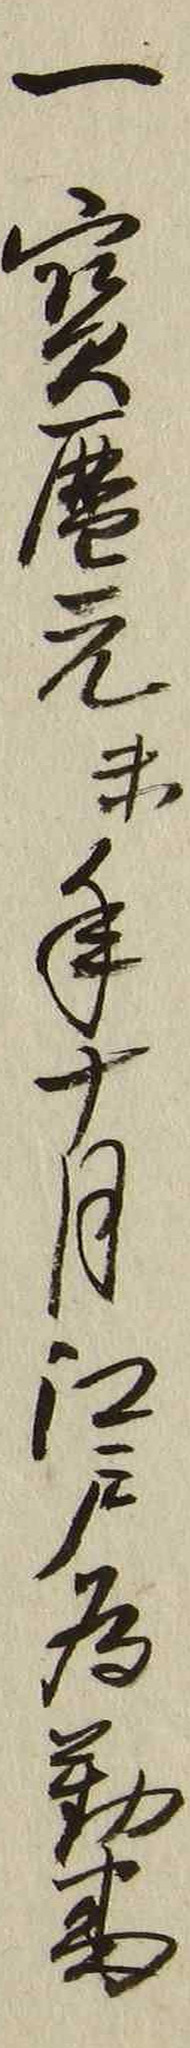一宝暦元未年十月江戸為勤番
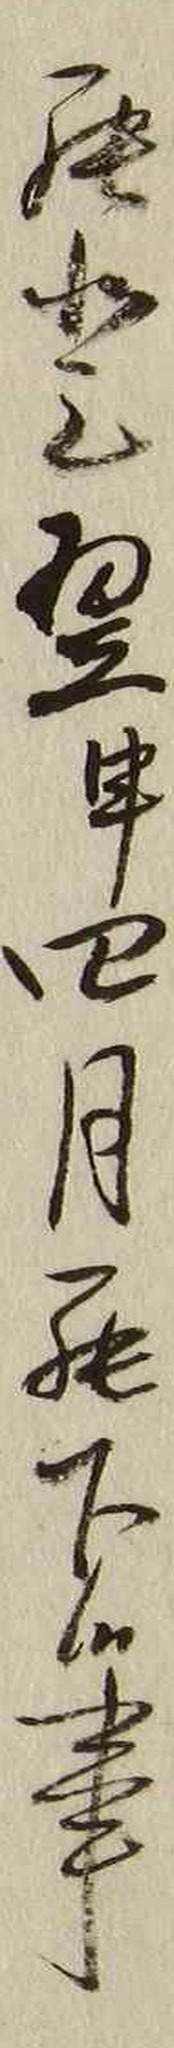罷登翌申四月罷下候事
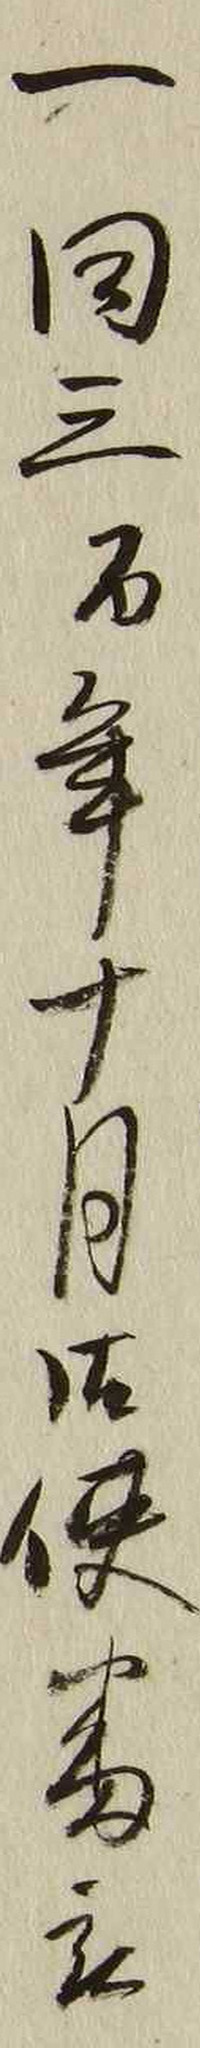一同三酉年十月御使番被
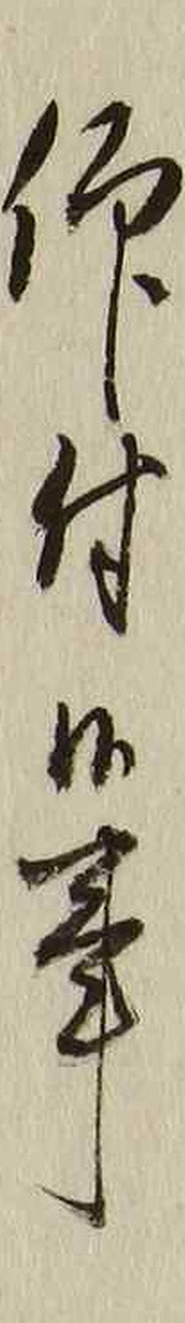仰付候事
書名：諸士系譜　巻之356　す之部6
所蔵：会津若松市立会津図書館
